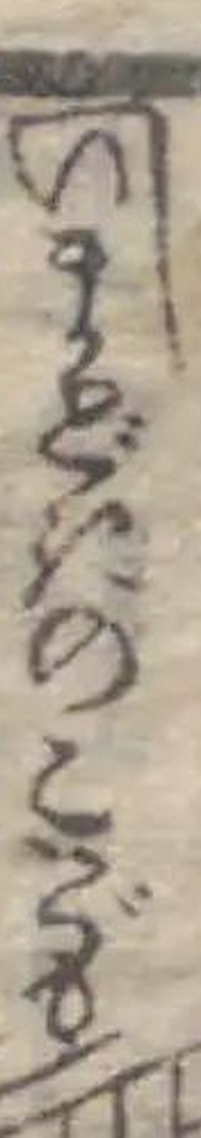〽いまどきのこども
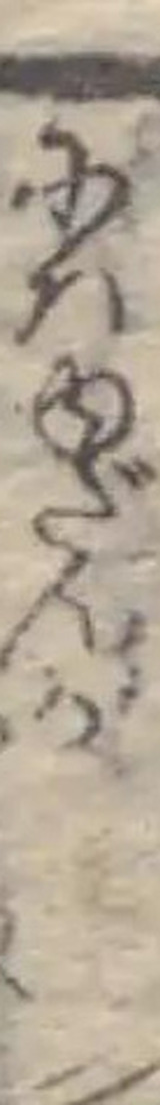にはゆだんが
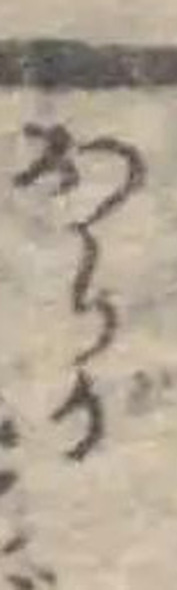おらが

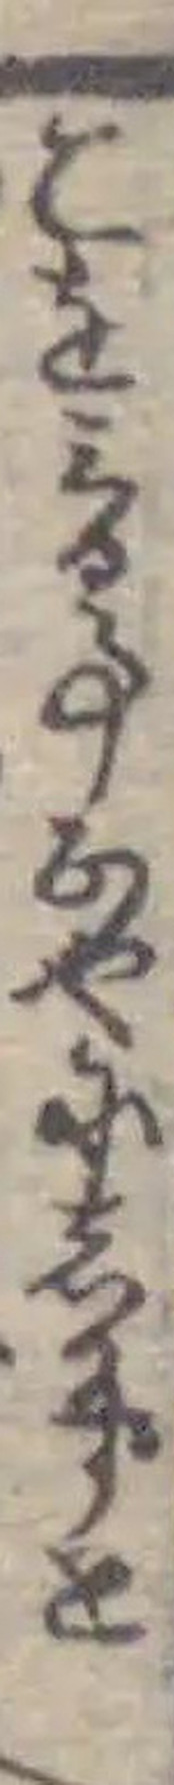こをみる事おやにしかずと
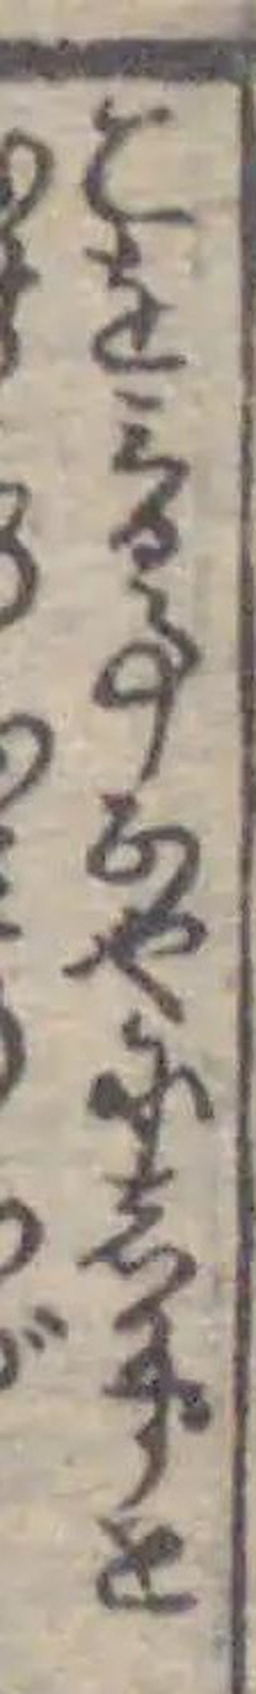こをみる事おやにしかずと
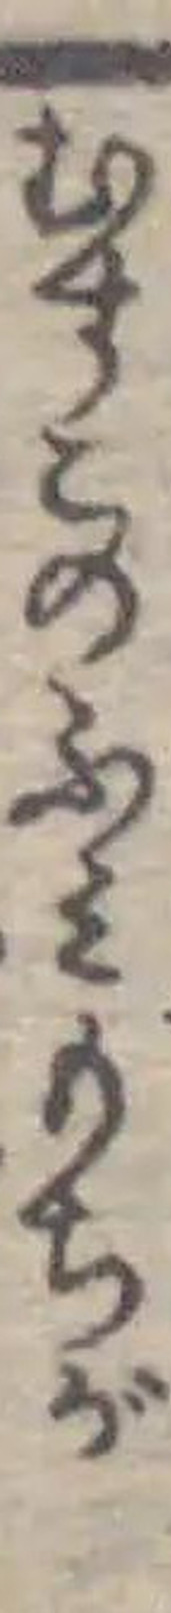むすこのふみもちが
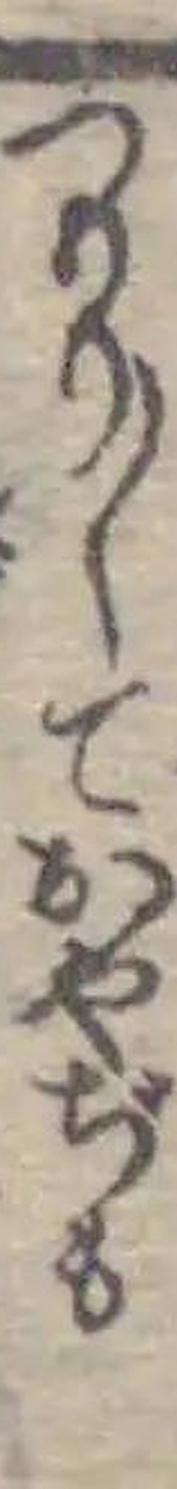つもり〳〵ておやぢも
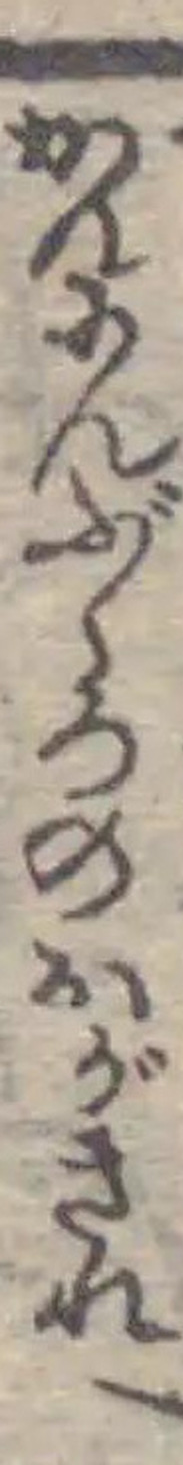かんにんぶくろのおがきれ
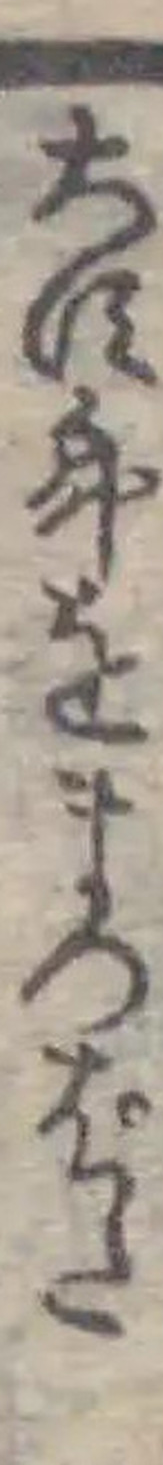大次郎をまつぱた
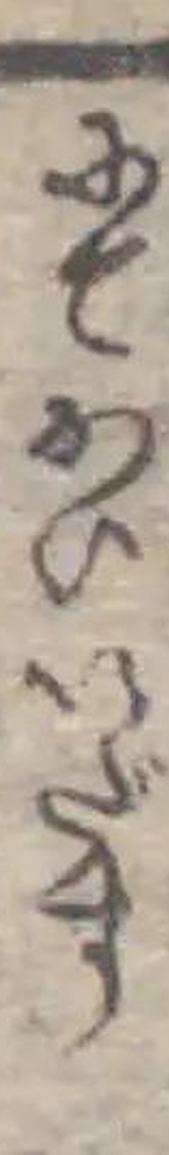にておいいだす
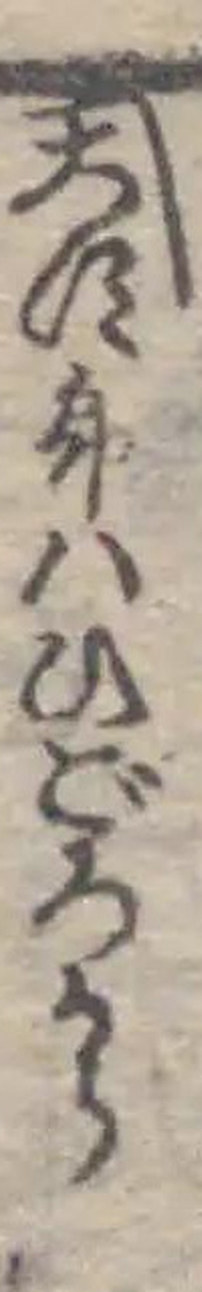〽大次郎はひごろから
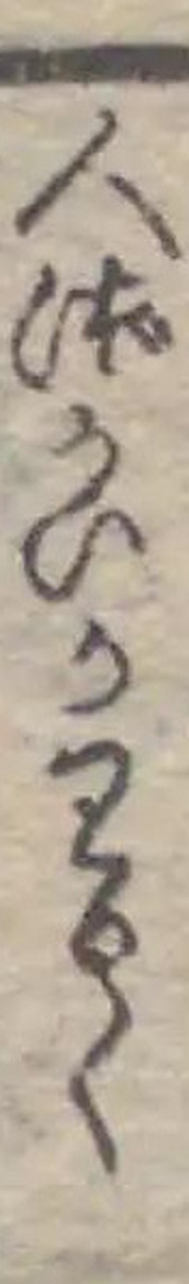人づかいかわるく
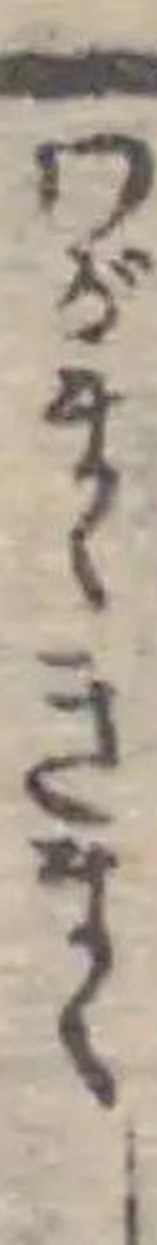わがまゝきまゝ
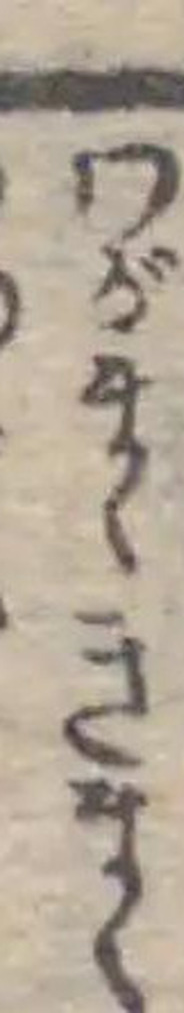わがまゝきまゝ
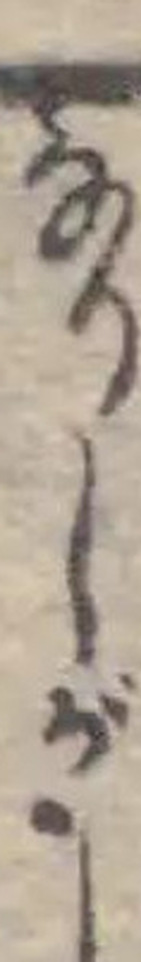なりしが
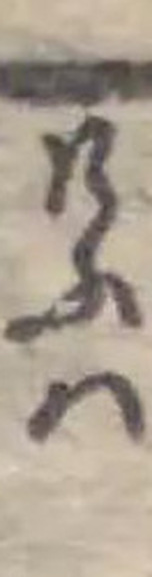けふは
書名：福壽海旡量品玉 3巻
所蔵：国立国会図書館 National Diet Library, JAPAN
